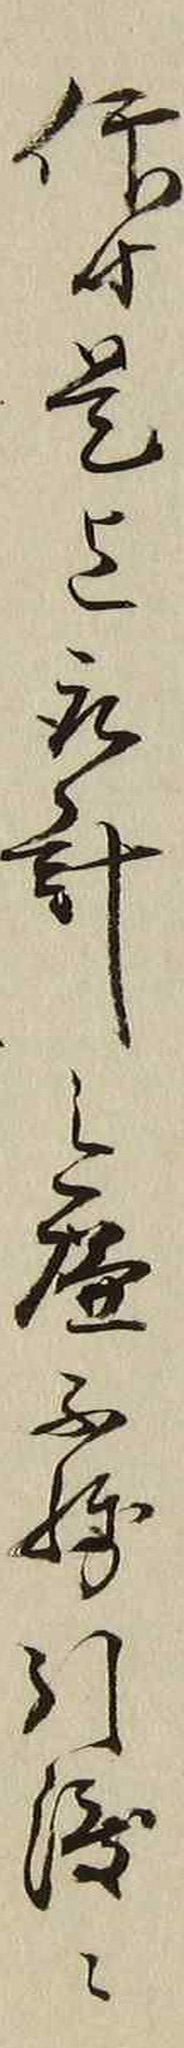仰付是迄取計之廉不残引渡ニ
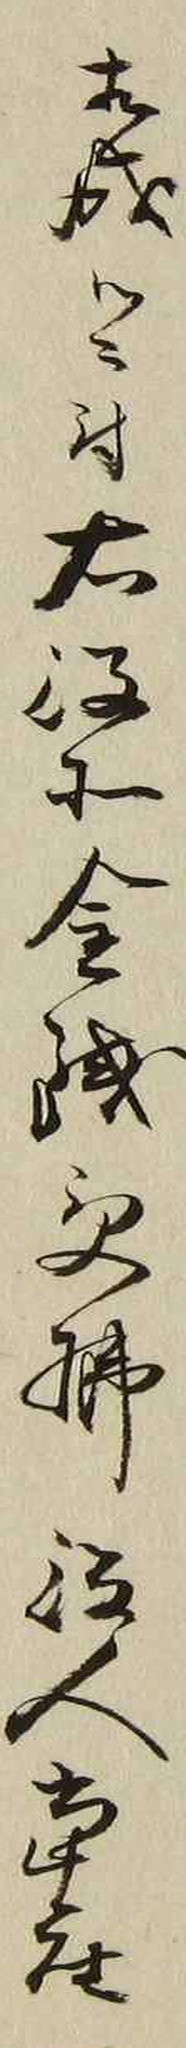相成候ニ付右役所金銭受払役人当座
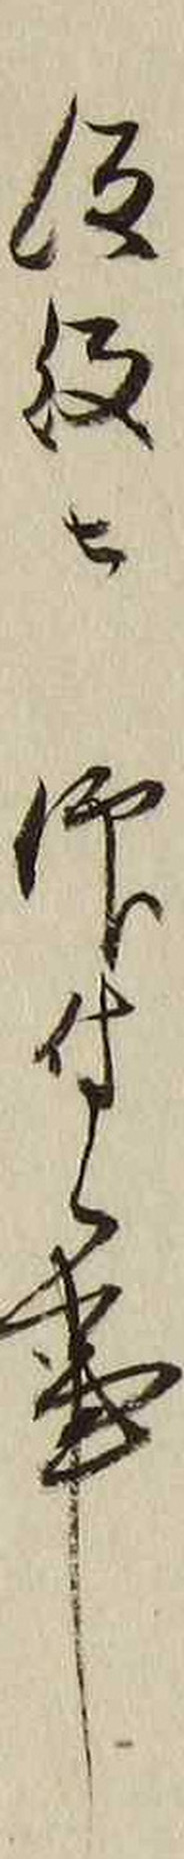仮役被仰付候事
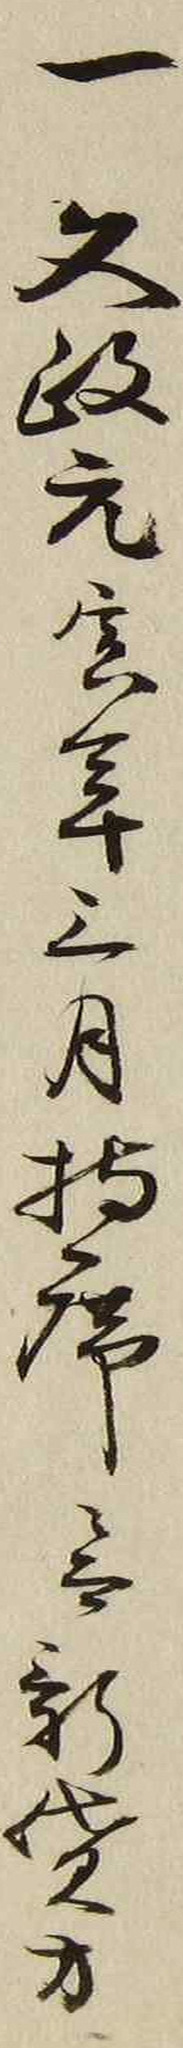一文政元寅年三月持席ニ而新貸方
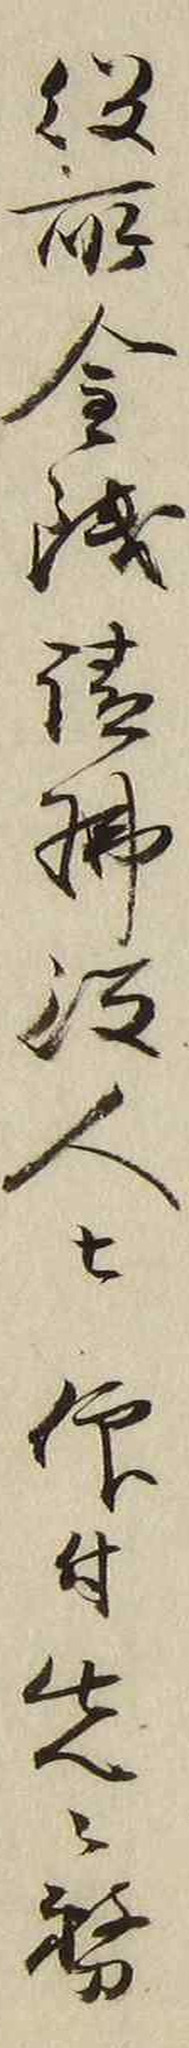役所金銭請払役人被仰付先々務
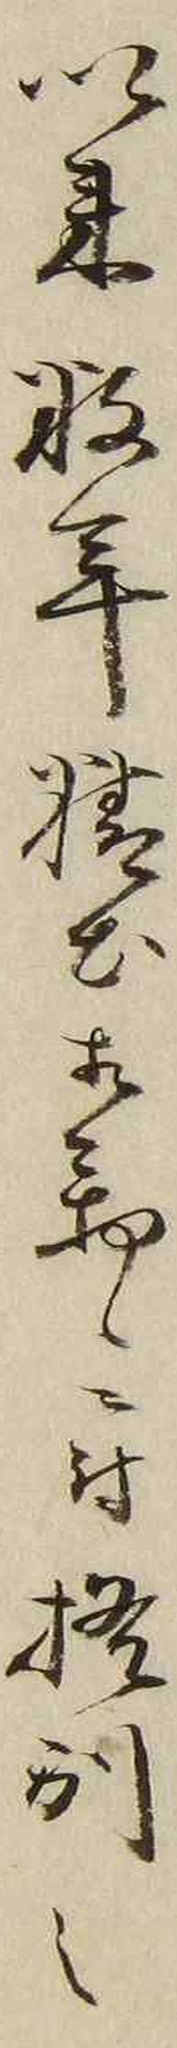以来数年精出相勤候ニ付格別

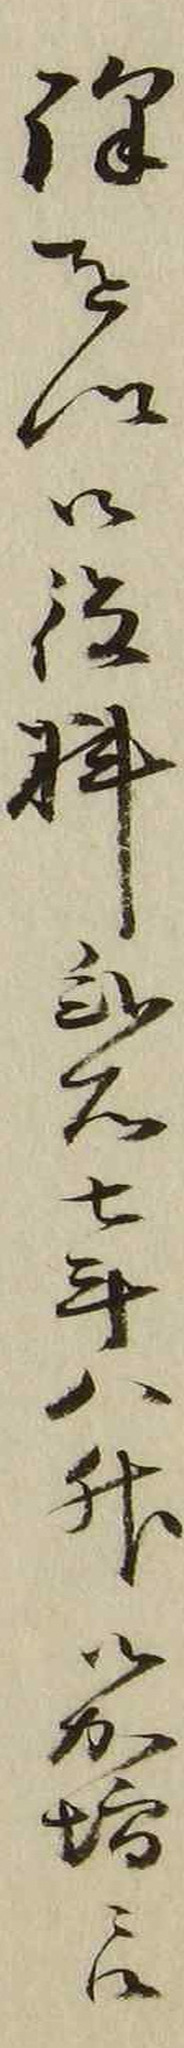訳を以御役料弐石七斗八升御加増ニ御
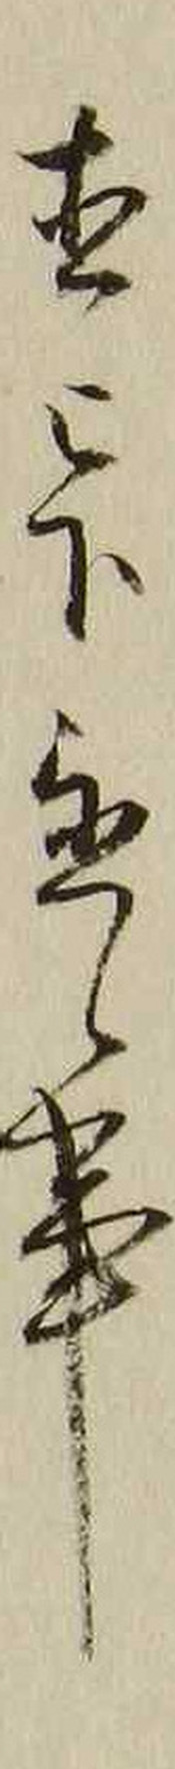直被下置候事
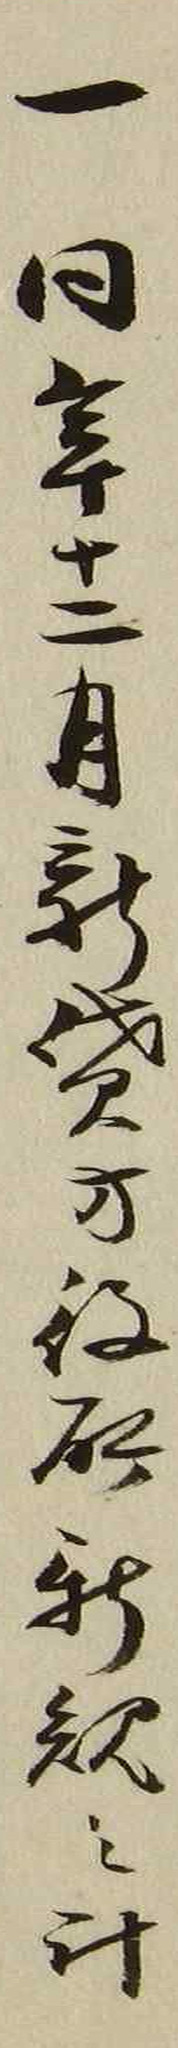一同年十二月新貸方役所新規之計
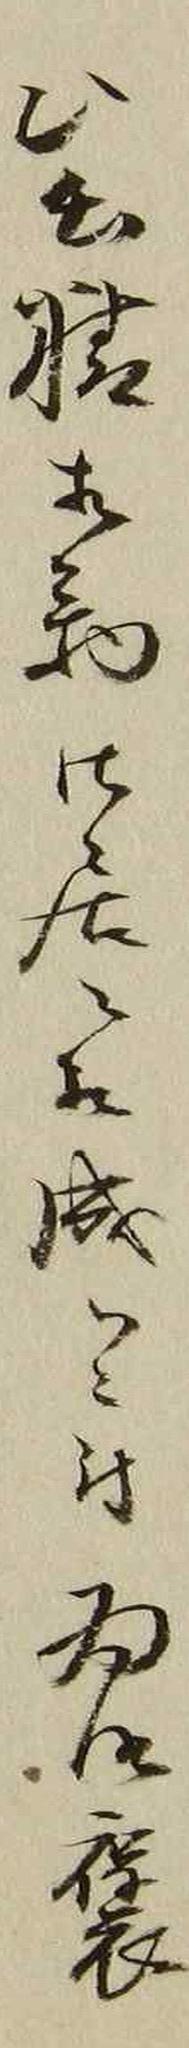ひ出精相勤仕居ニ相成候ニ付為御褒
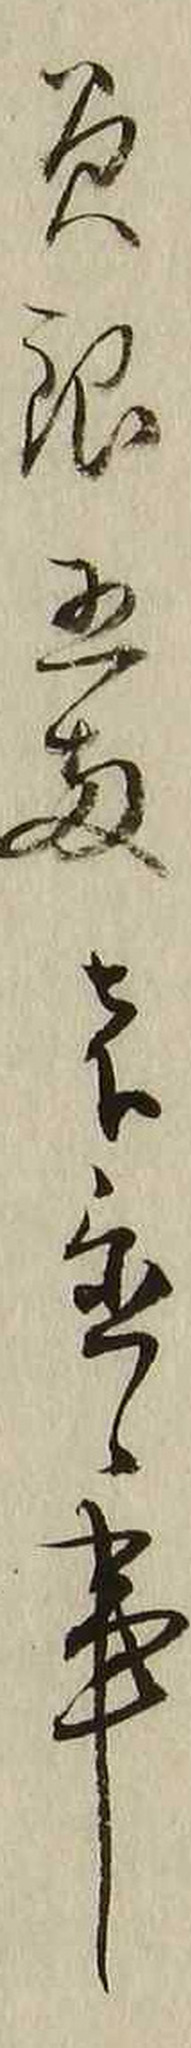美銀五両被下置候事
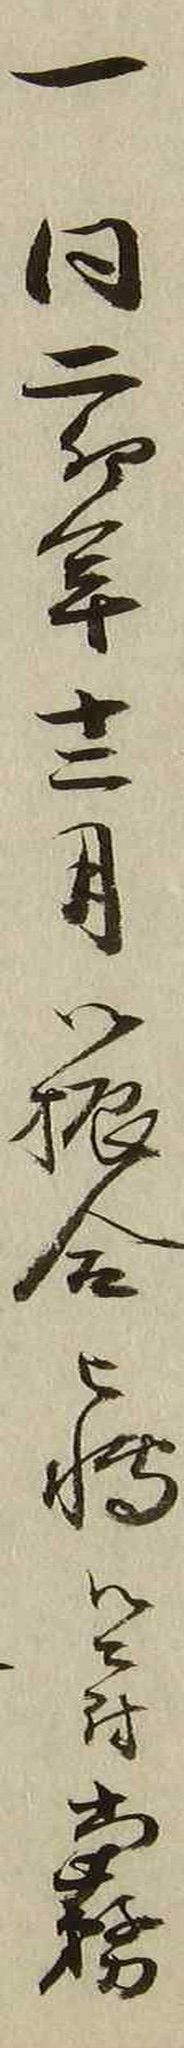一同二卯年十二月御振合被転候ニ付当務
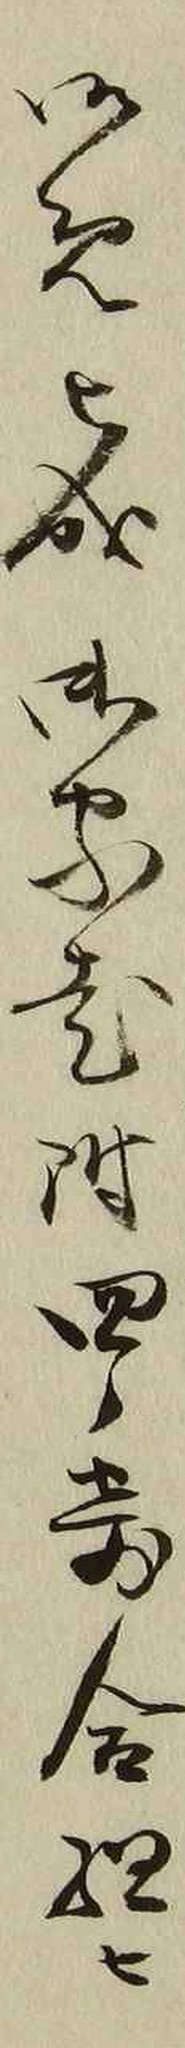御免被成御家老附四ノ寄合組被
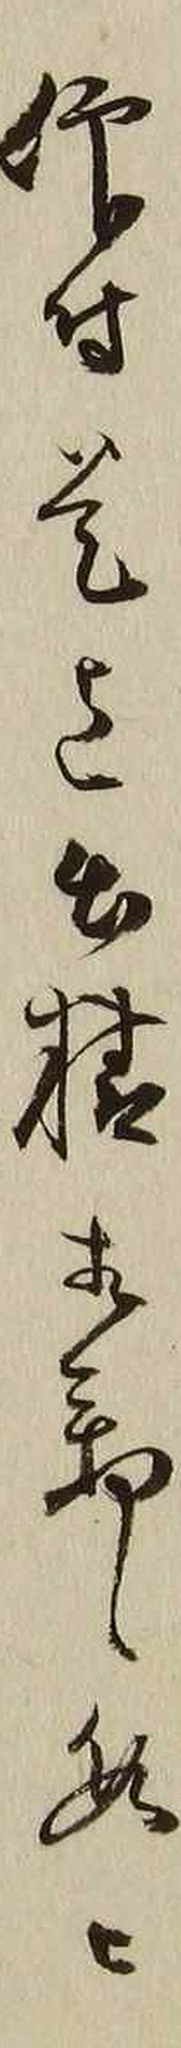仰付是迄出精相勤候段被
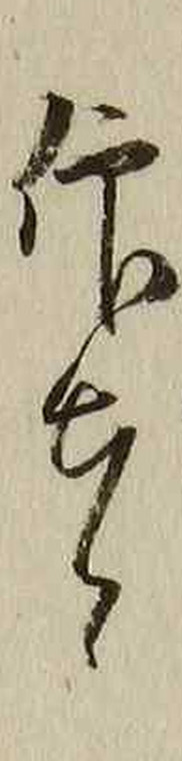仰出候
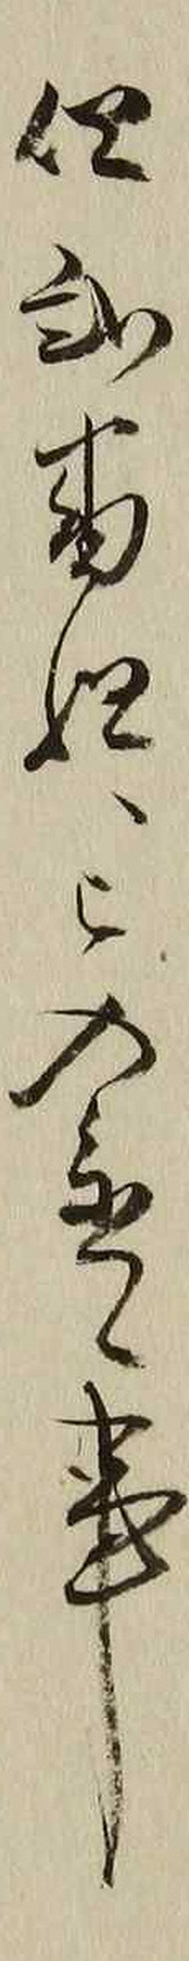但弐番組へ被入置候事
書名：諸士系譜　巻之291　さ之部23
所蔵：会津若松市立会津図書館
